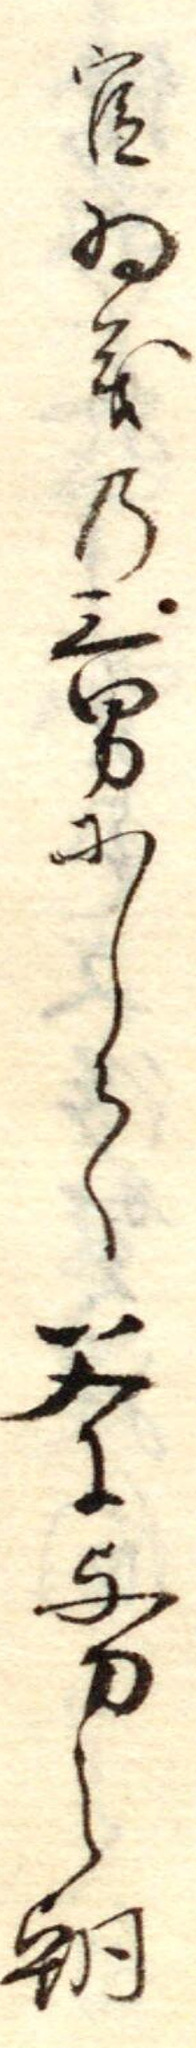官為義の三男にして父に与力し朝
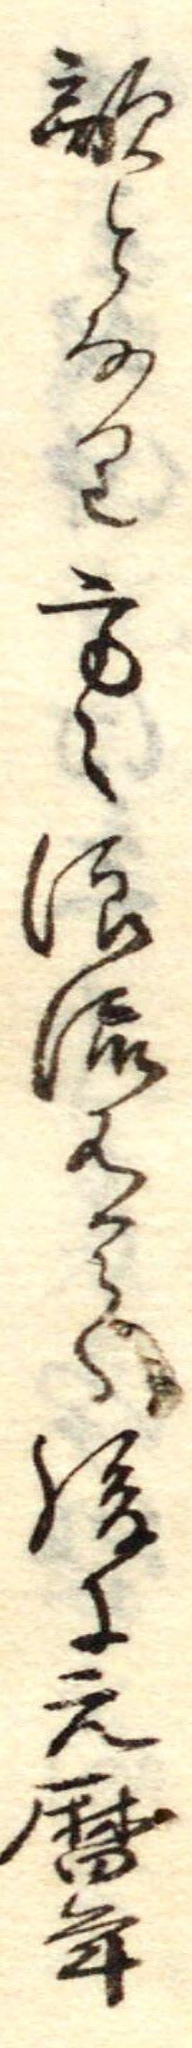敵となり方々浪流有て後に元暦年

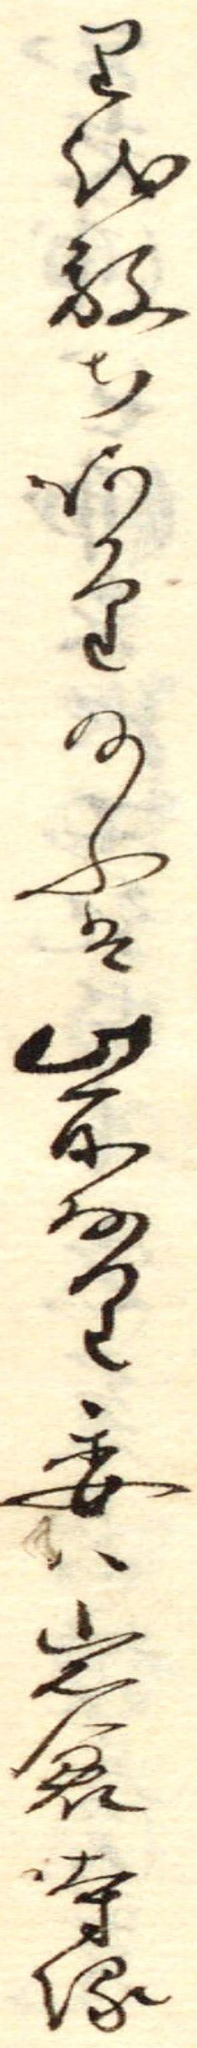りを放ちあり給ふは此所なり委は岩倉寺縁
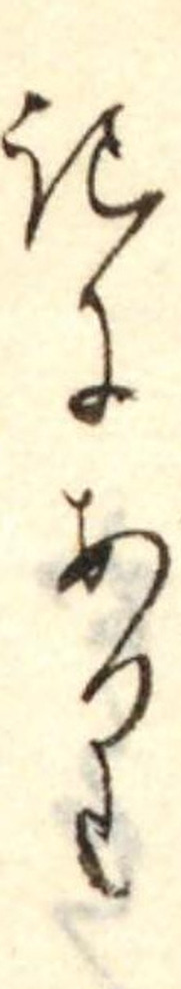記にあり
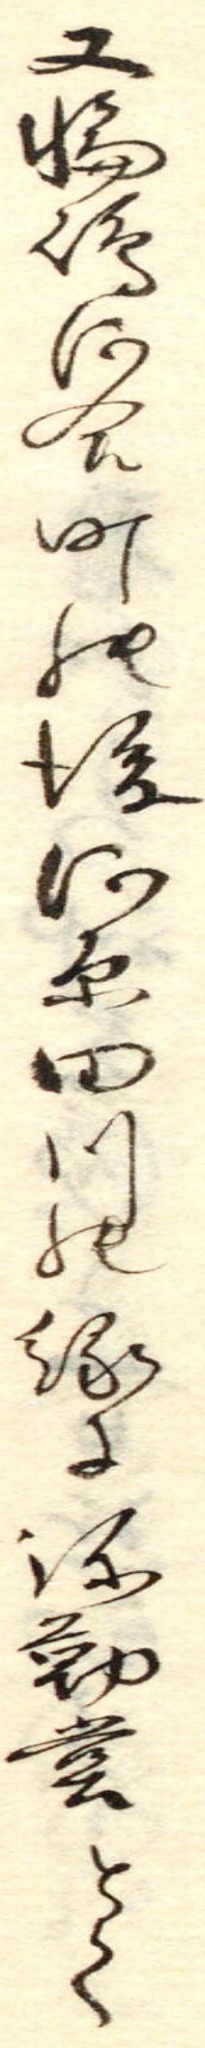又輪嶋河合町の後河原田川の縁に弥勒堂とて
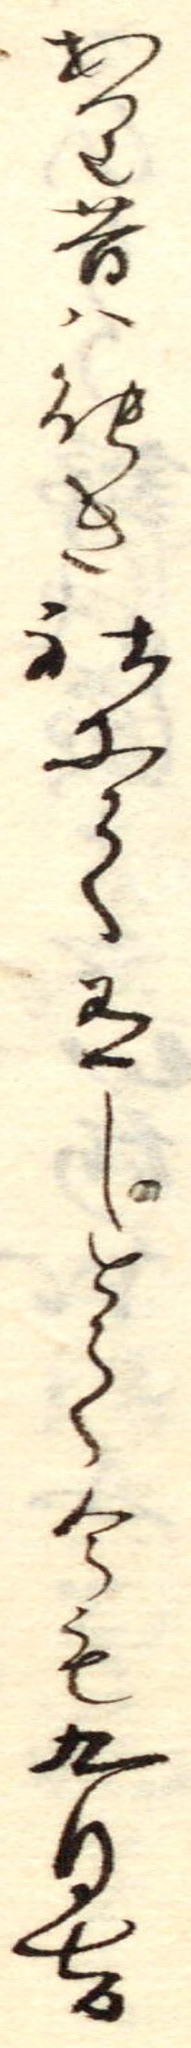あり昔はよき社にて有しとて今も九月七日
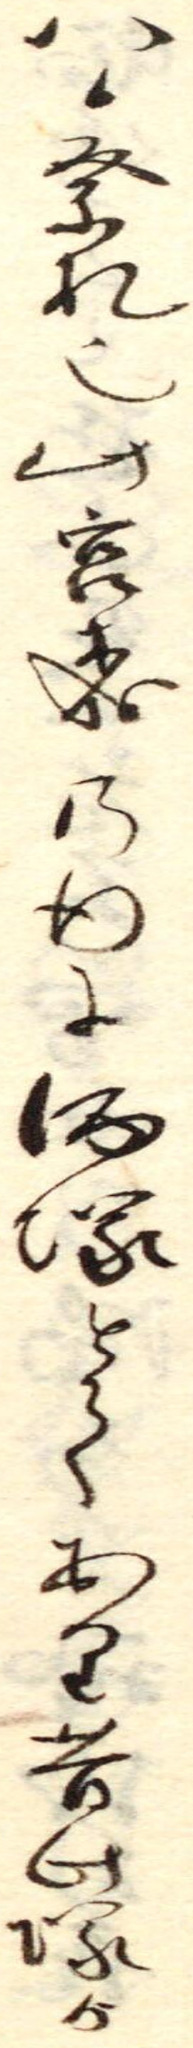八日祭礼也此宮森の内に酒塚とてあり昔此塚ゟ
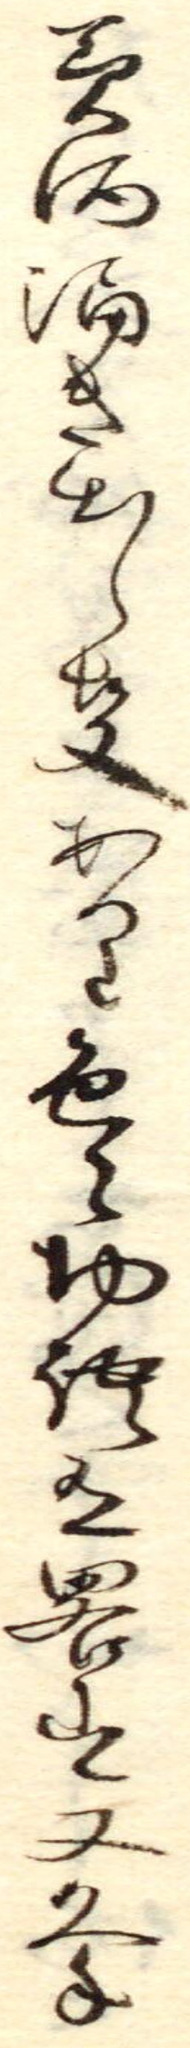美酒涌き出し候事あり色々物語有略す又久手
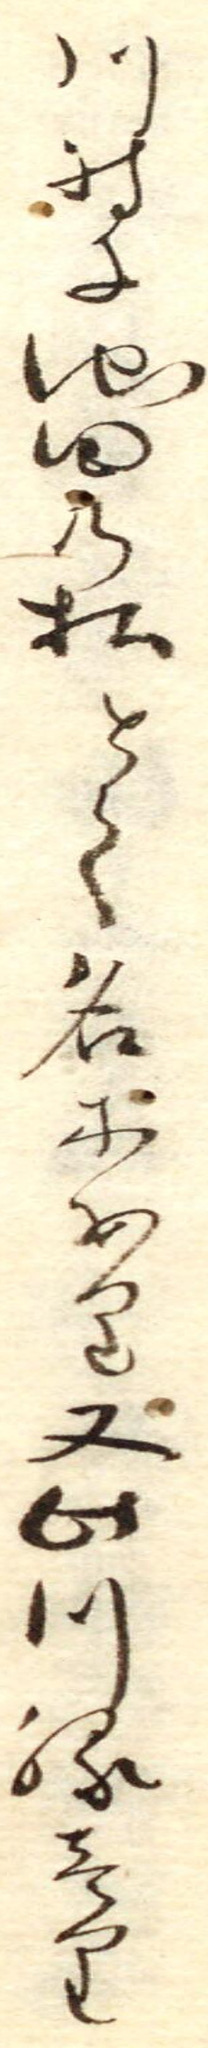川村に池田の松とて名木あり又此川縁壱里
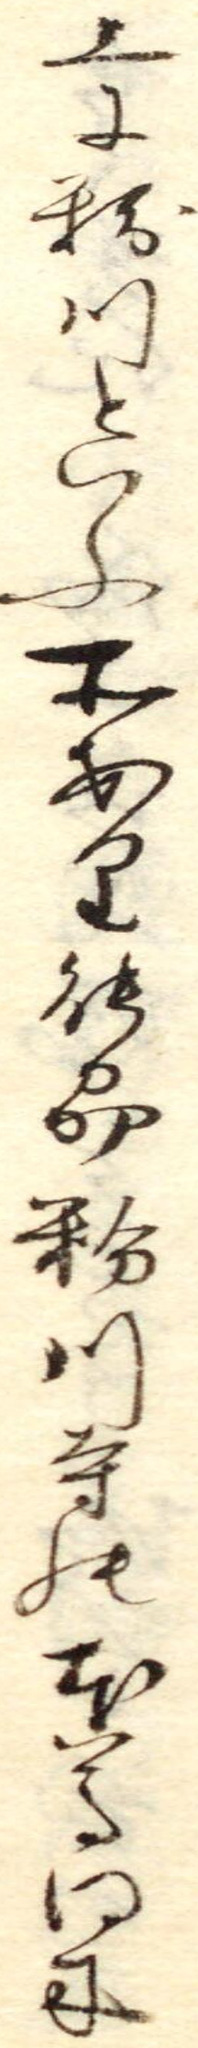上に粉川といふ所あり能州粉川寺の本尊同木
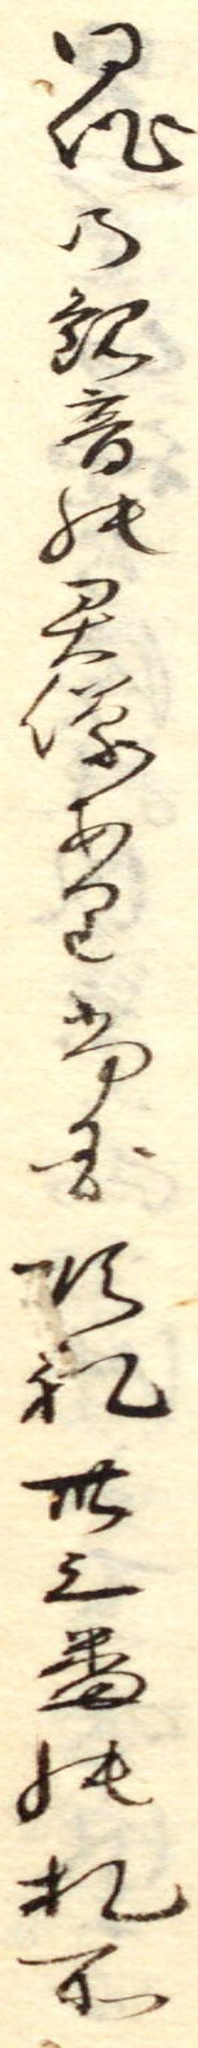同作の観音の異像あり当国順礼丗三番の札所
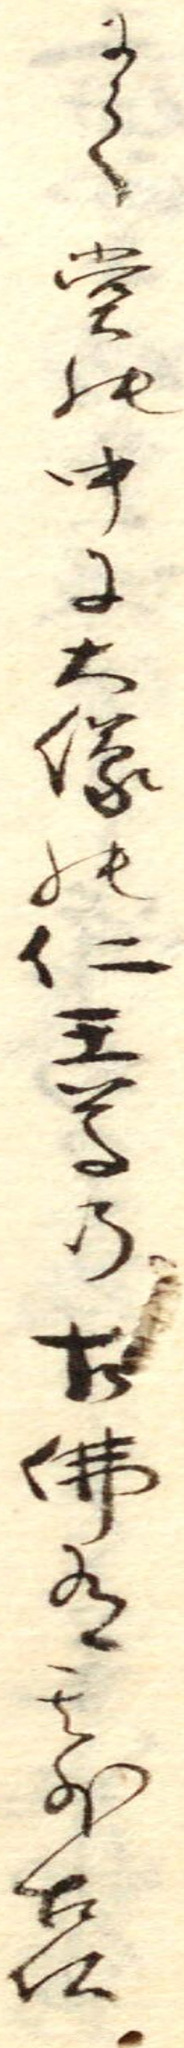にて堂の中に大像の仁王尊の古仏有其外古仏
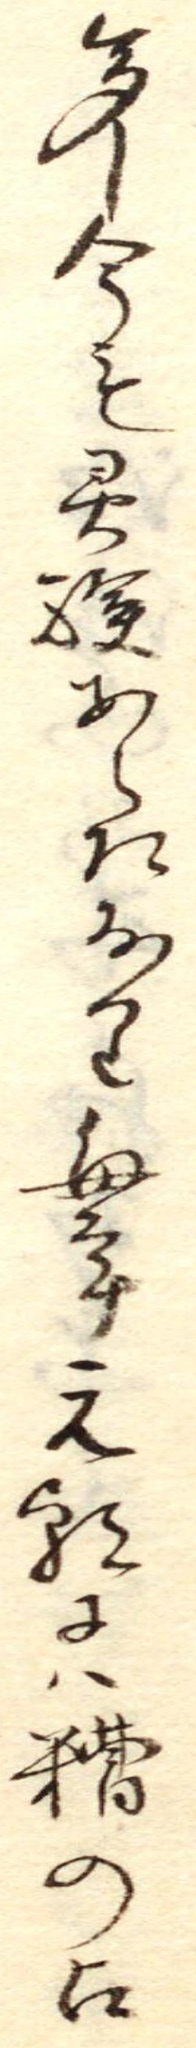多し今も霊験あらたなり毎年元朝には糟の占
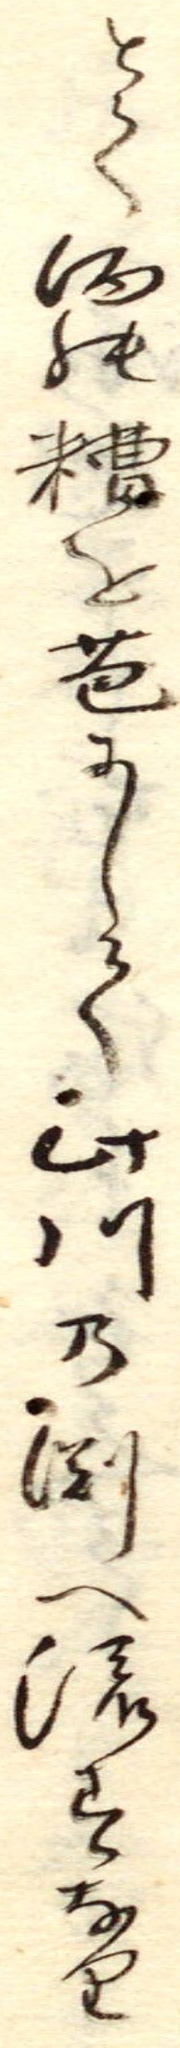とて酒の糟を苞にして此川の渕へ流すなり
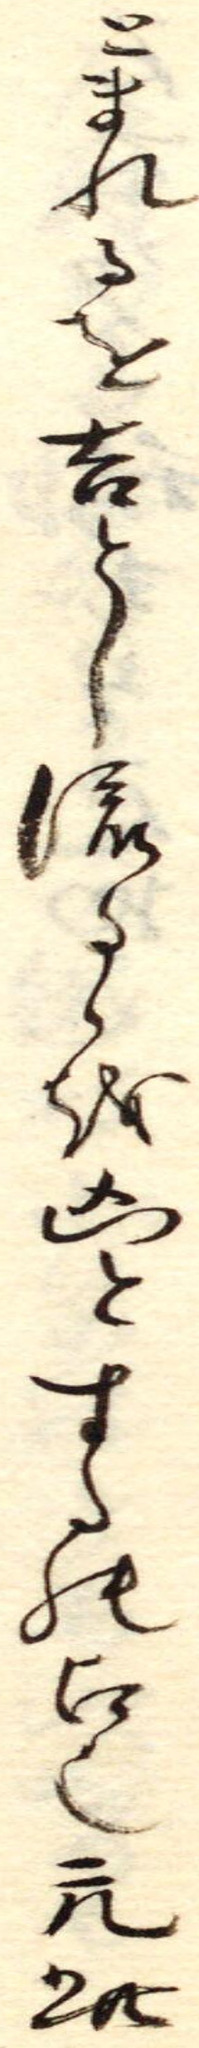とまれるを吉とし流るゝを凶とするの占也元此
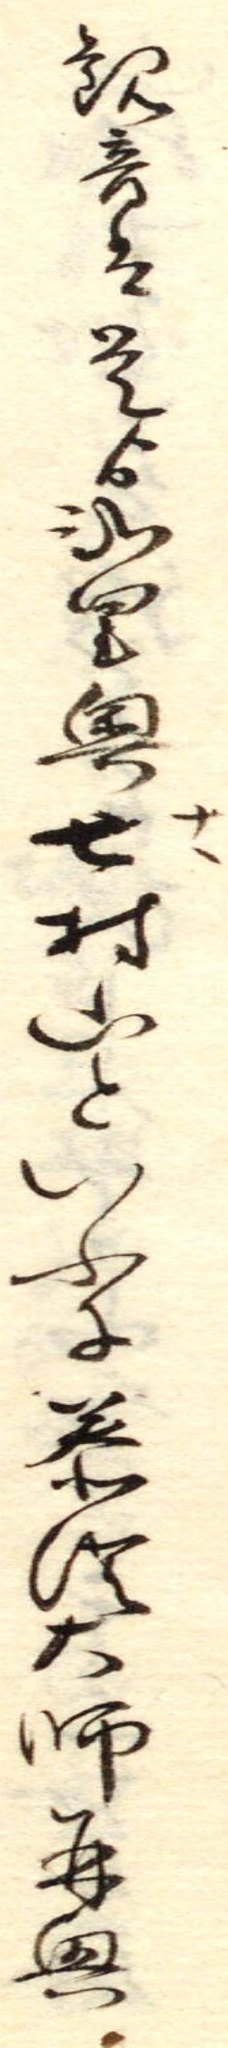観音は是ゟ弐里奥七村山といふに泰澄大師再興
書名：能登名跡誌
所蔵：Ishikawa Prefectural Library
